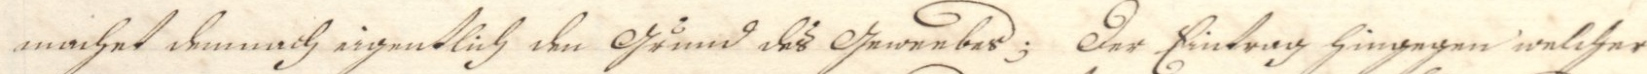machet demnach eigentlich den Grund des Geweebes. Der Eintrag hingegen welcher
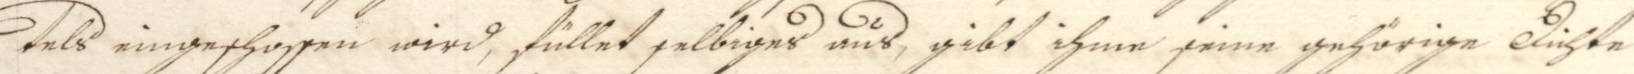tels eingeschossen wird, füllet selbiges aus, gibt ihme seine gehörige Dichte
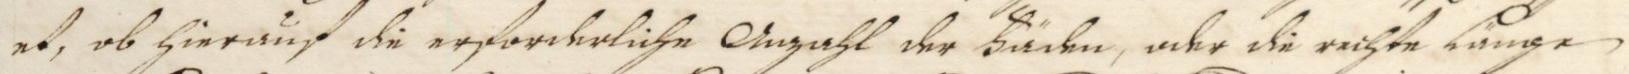et, ob hierauf die erforderliche Anzahl der Fäden, oder die rechte Länge
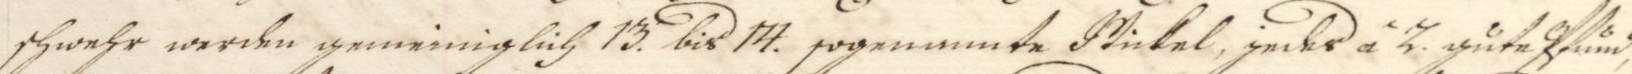schwehr werden gemeiniglich 13. bis 14. sogenannte Wickel, jedes à 2. gute Pfund,
